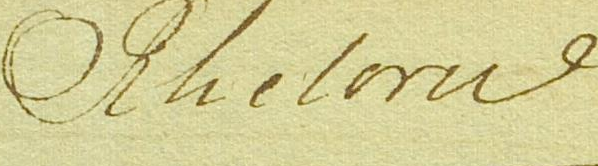Rhetoric
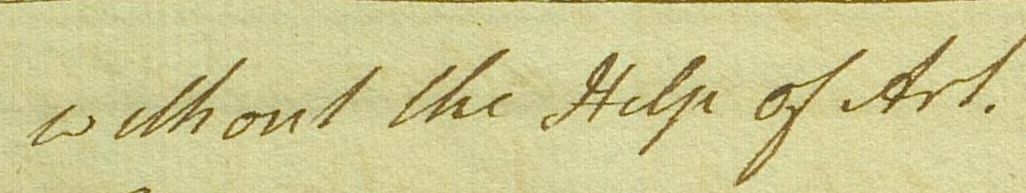without the Help of Art.
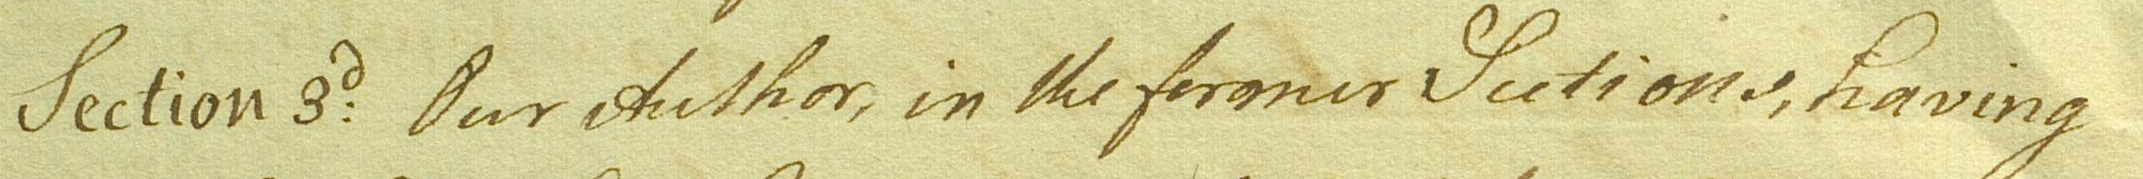Section 3^d: Our Author, in the former Sections, having
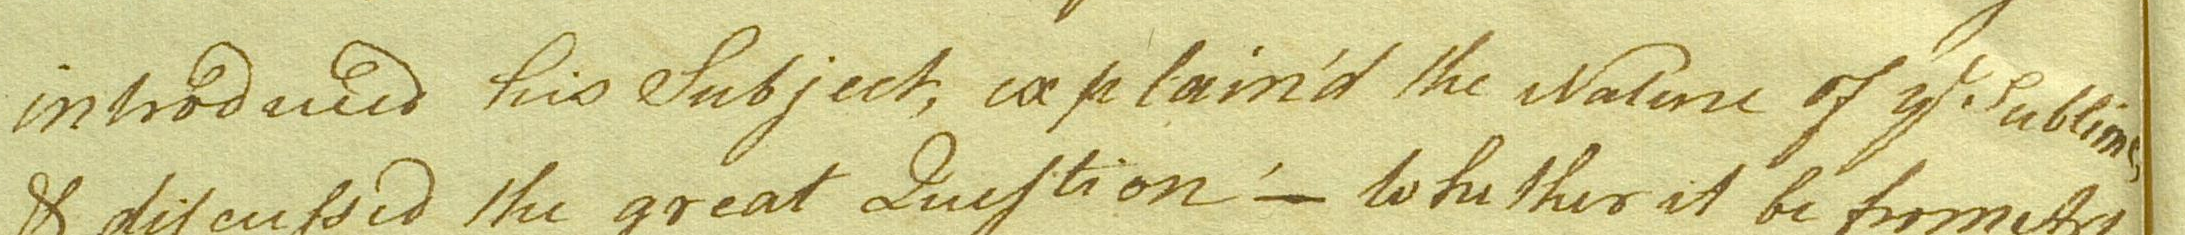introduced his Subject, explain'd the Nature of y^e Sublime
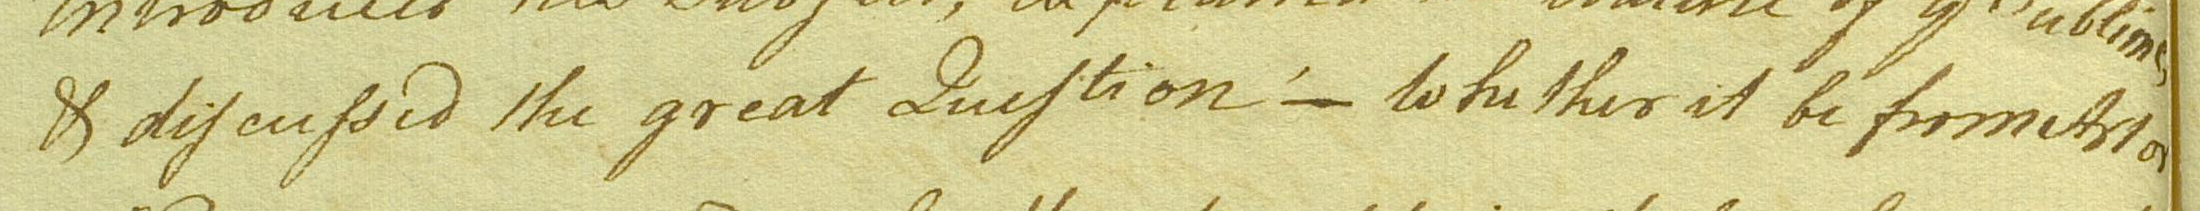& discussed the great Question – whether it be from Art or
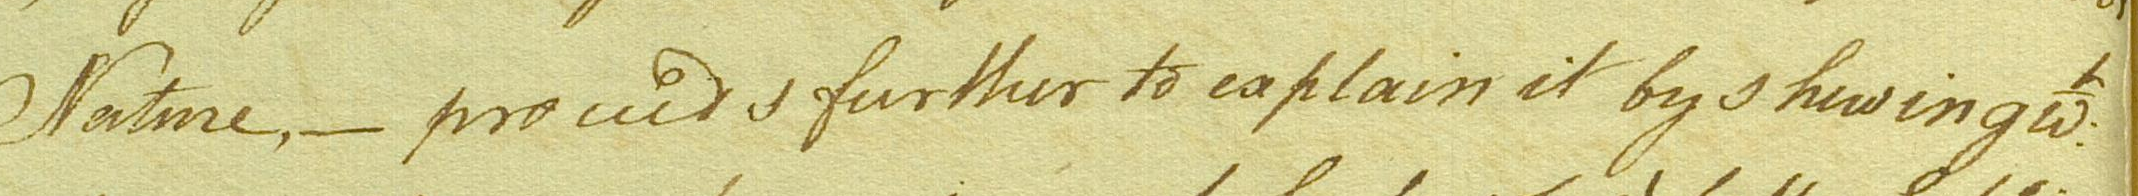Nature,– proceeds further to explain it by shewing w^h:
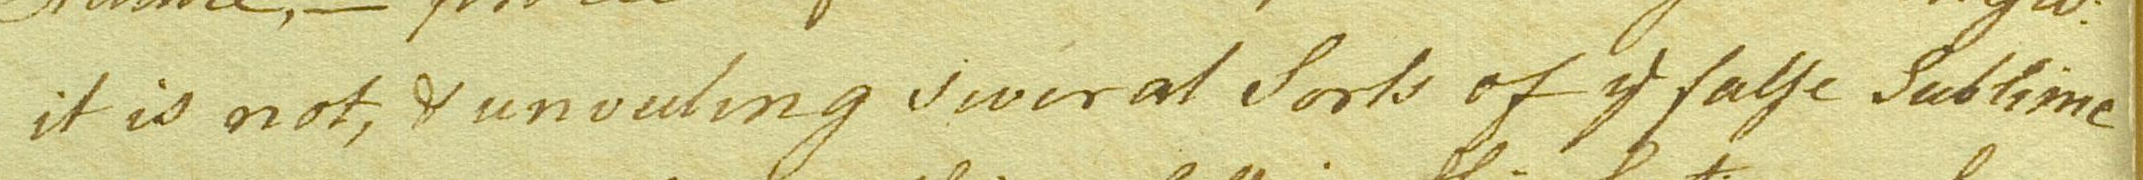it is not, & unveiling several Sorts of y^e false Sublime
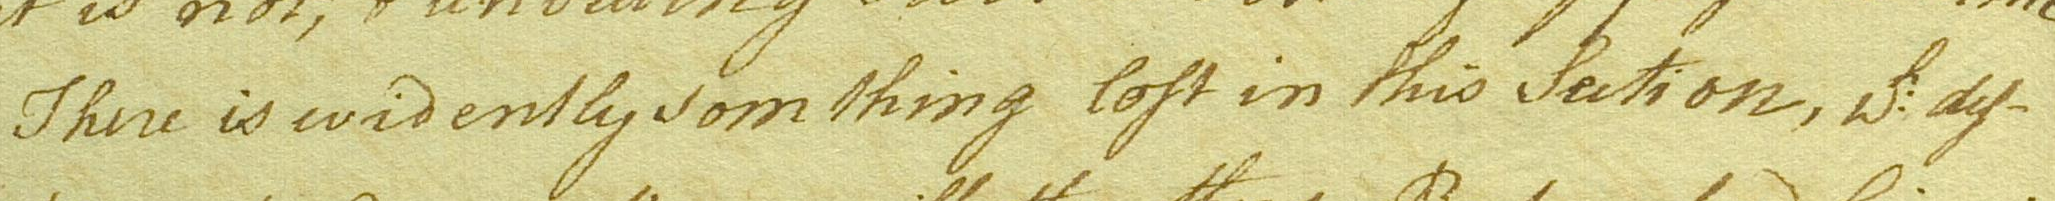There is evidently something lost in this Section, w^h des-
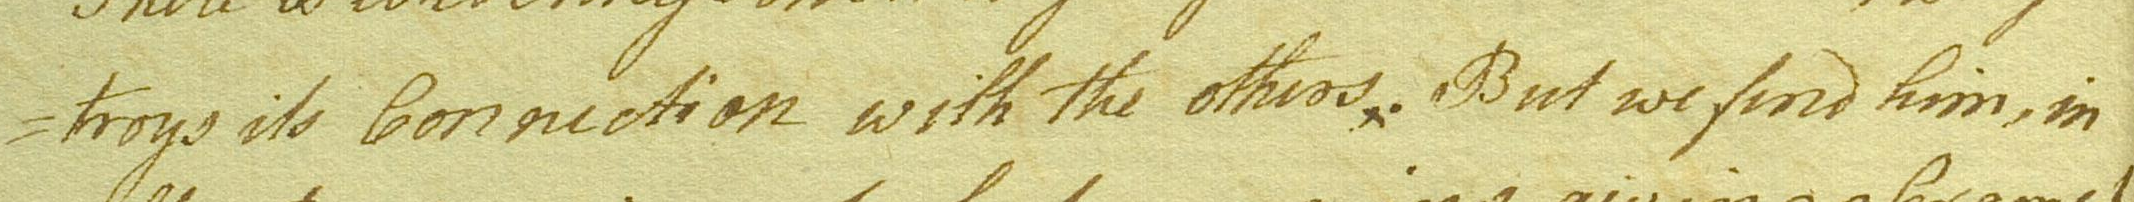-troys its Connection with the others. But we find him, in
